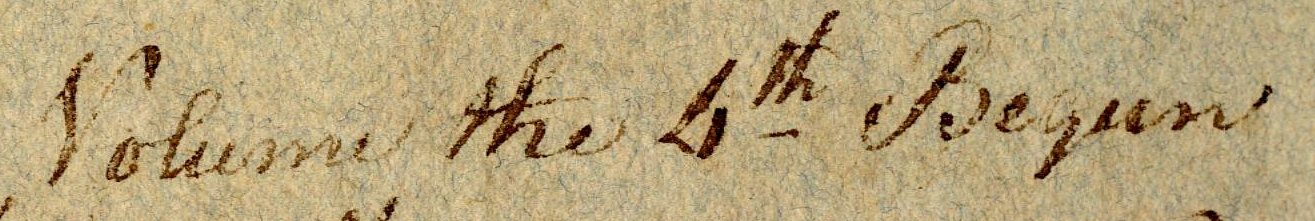Volume the 4^th Begun
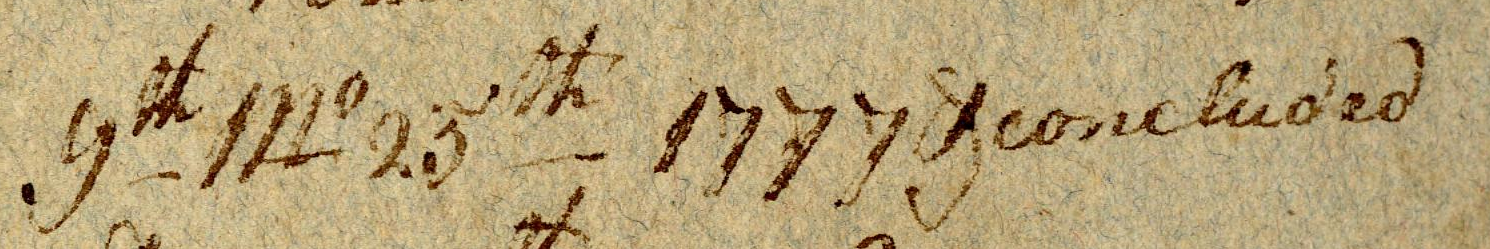9^th M^o 25^th 1777 & concluded
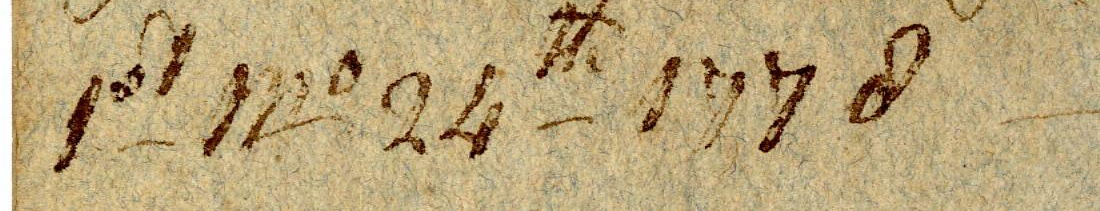1^st M^o 24^th 1778-
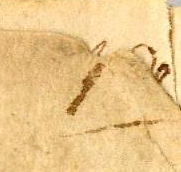1
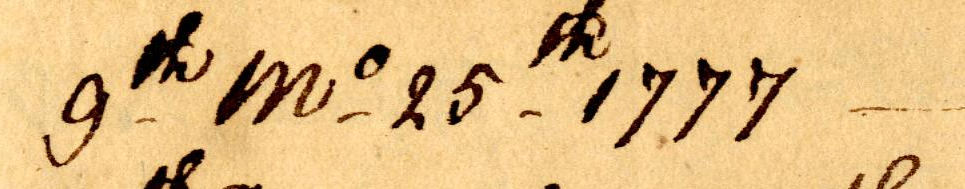9^th M^o 25^th 1777
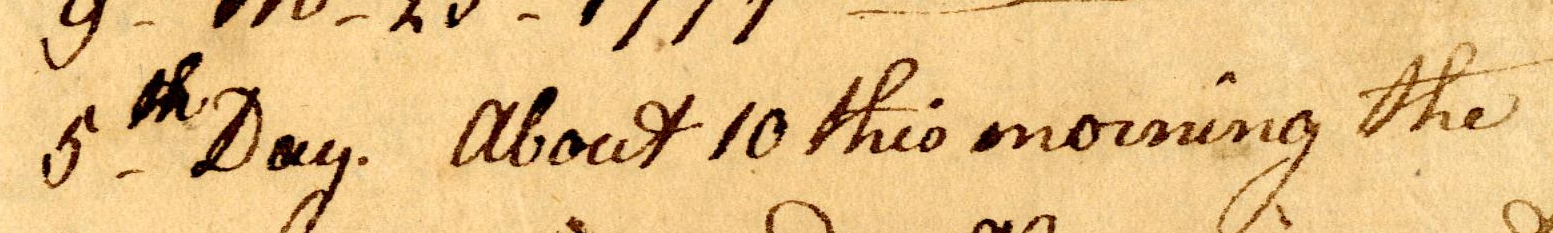5^th Day. About 10 this morning the
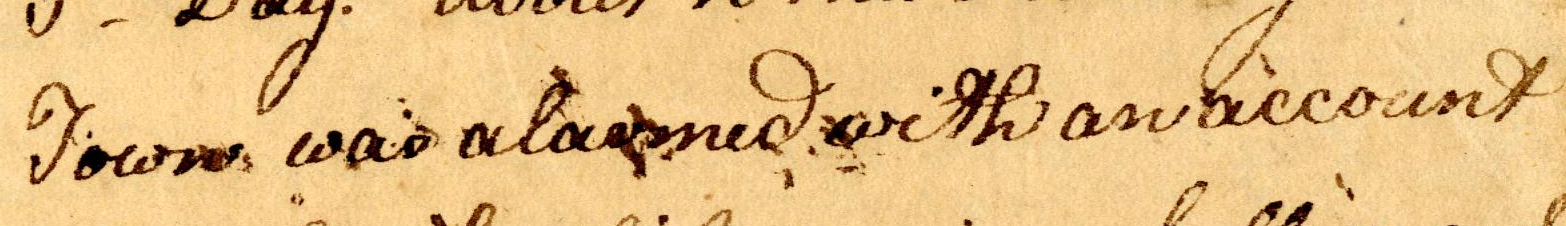Town was alarmed with an account
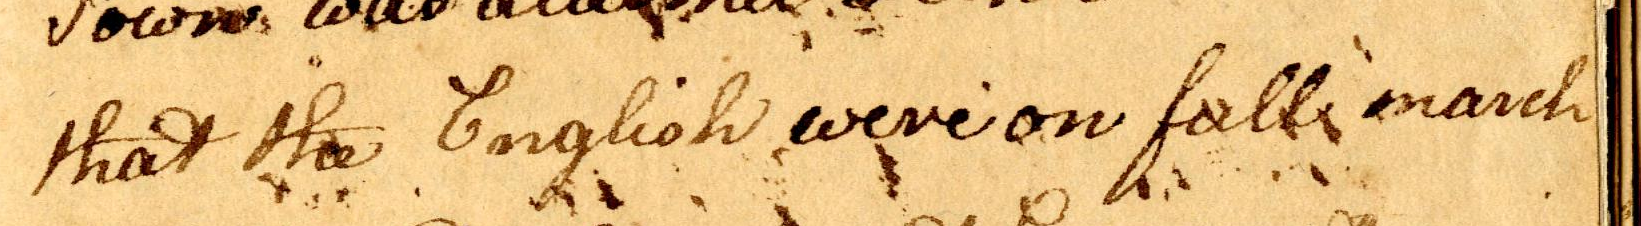that the English were on full march
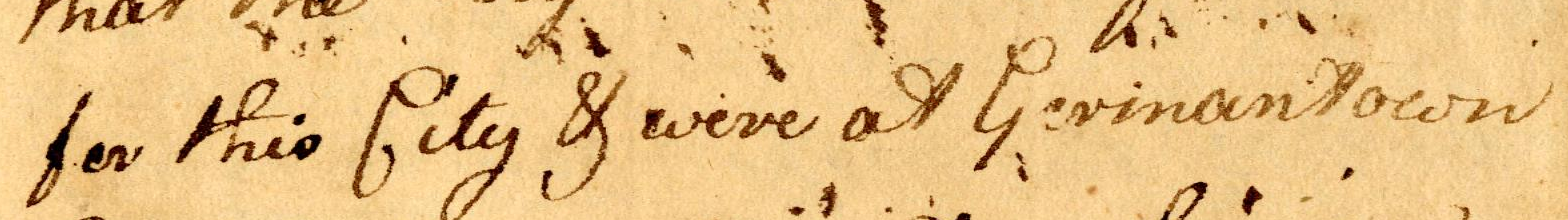for this City & were at Germantown
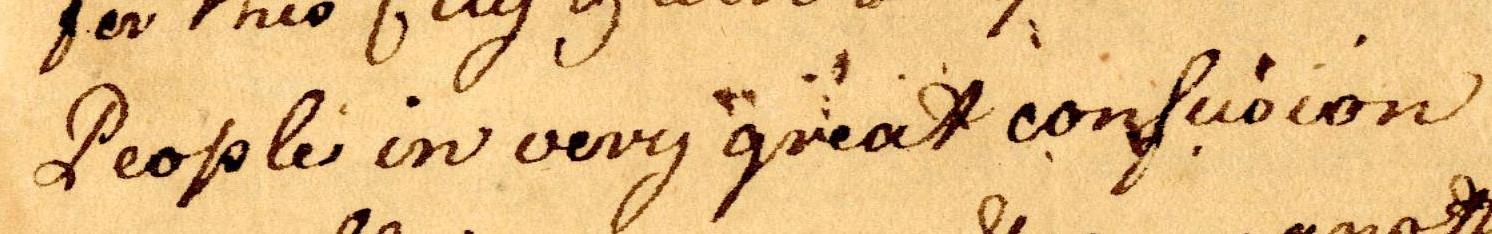People in very great confusion
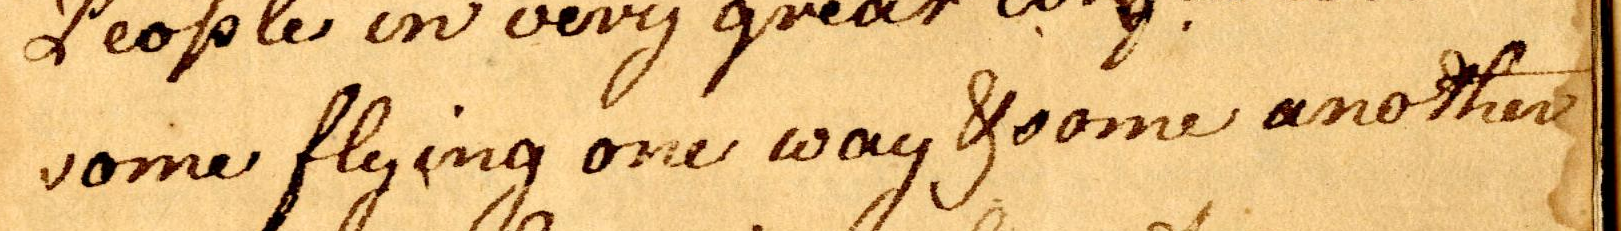some flying one way & some another
